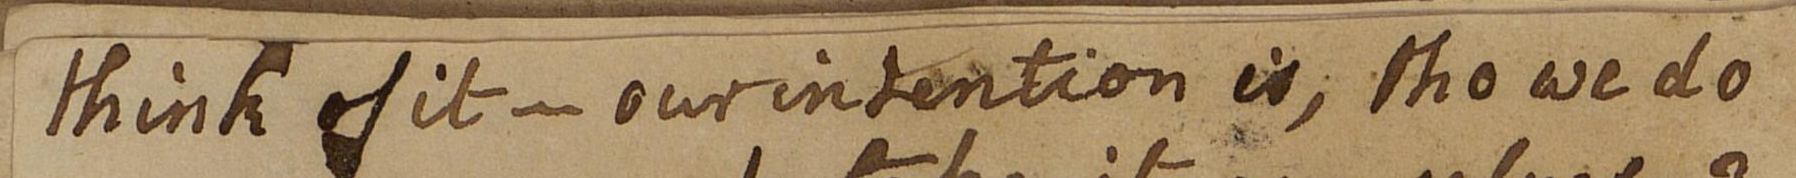think of it- our intention is, tho we do
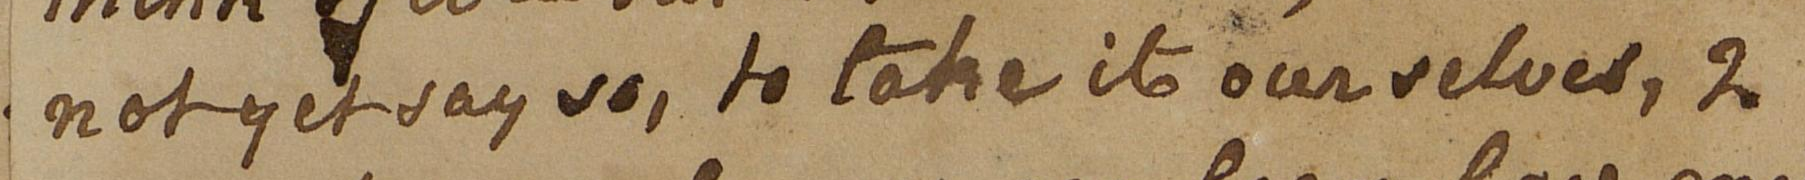not yet say so, to take it ourselves, 2
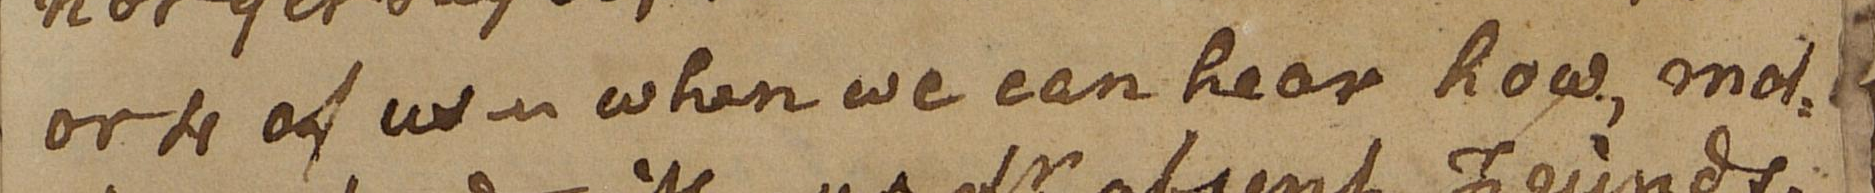or 4 of us- when we can hear how, mot
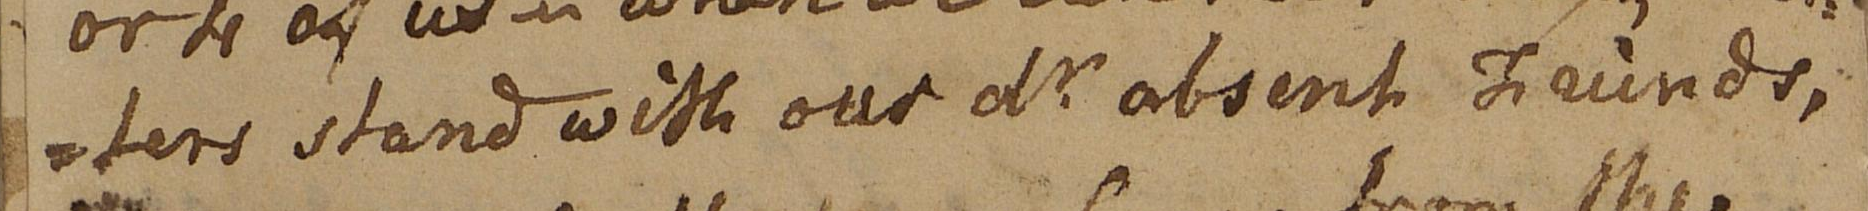-ters stand with our d^r. absent Friends,
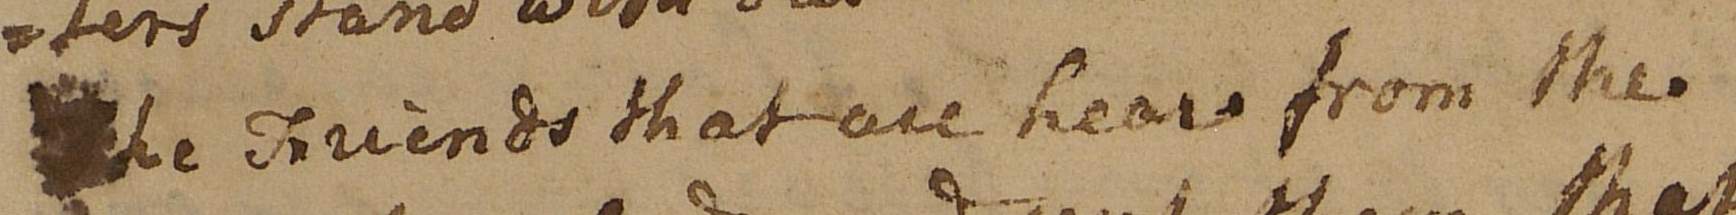The Friends that are hear from the
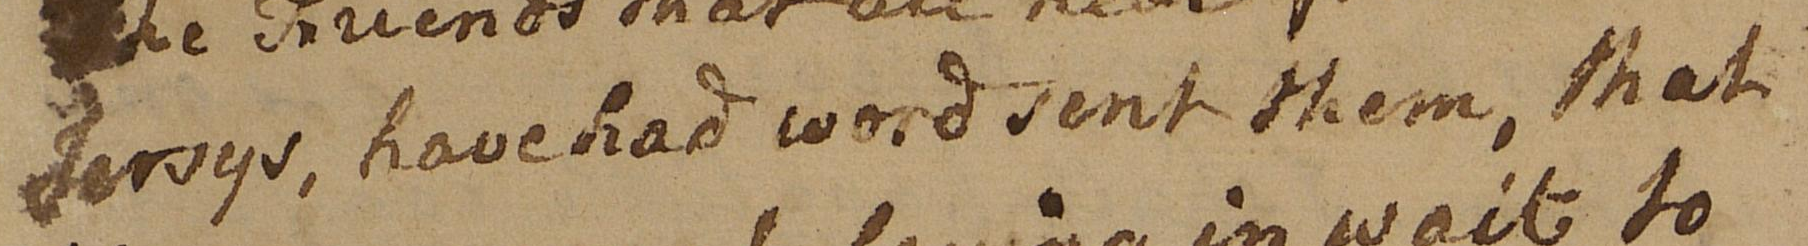Jersys, have had word sent them, that
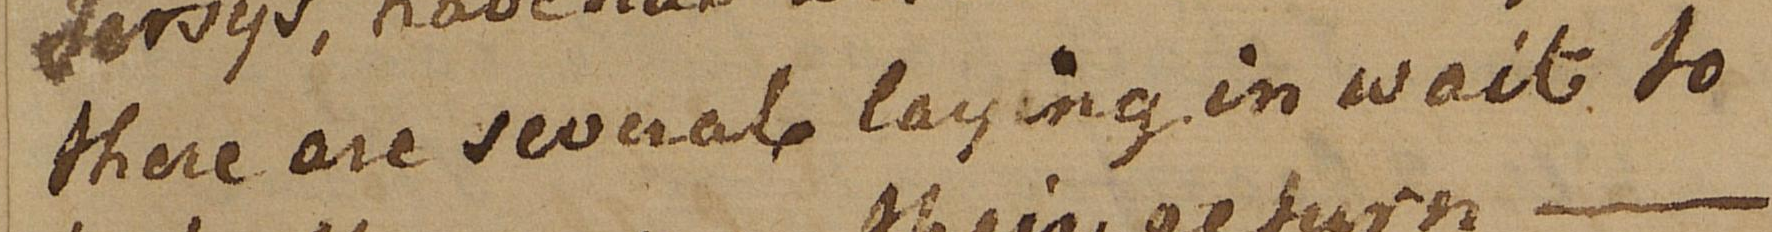there are several laying in wait to
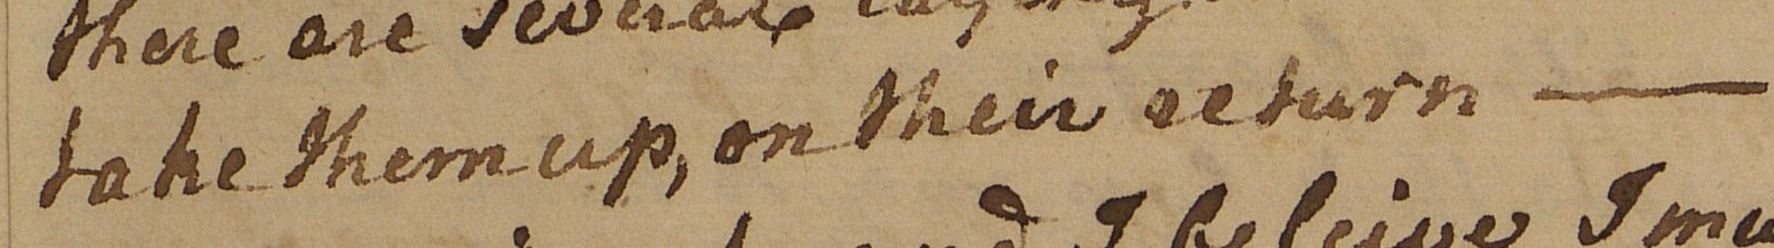take them up, on their return-
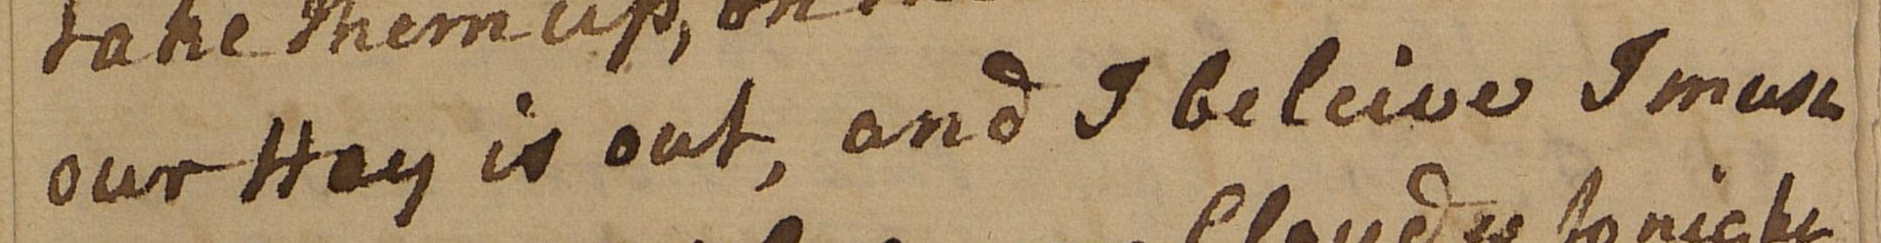our Hay is out, and I beleive I must
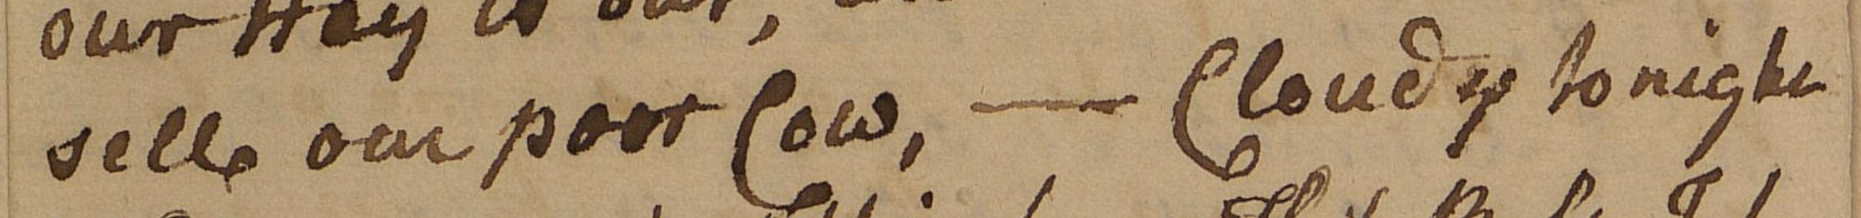sell our poor Cow,- Cloudy to night
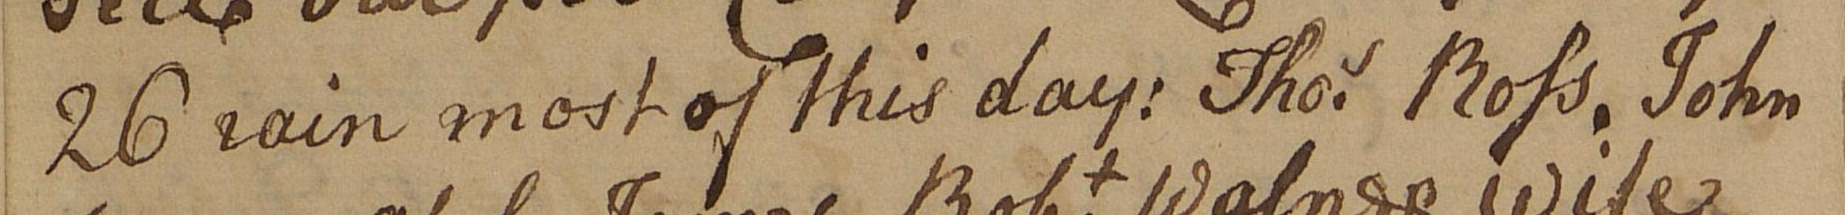26 rain most of this days; Tho.^s Ross, John
